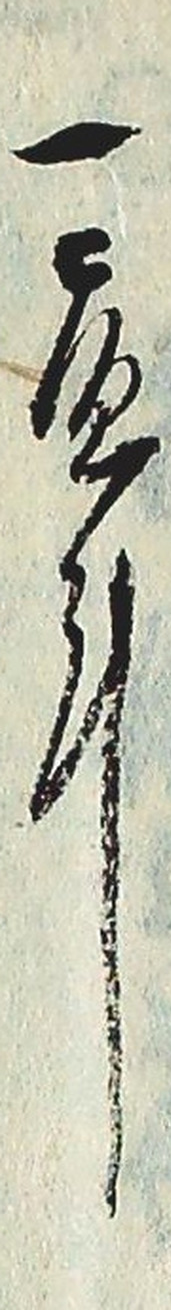一昼計
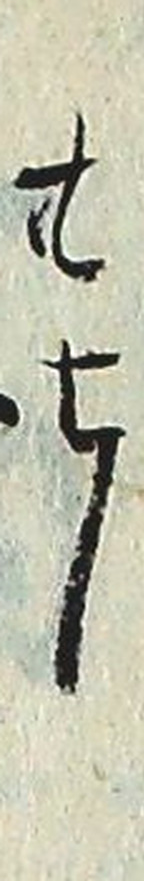廿七日
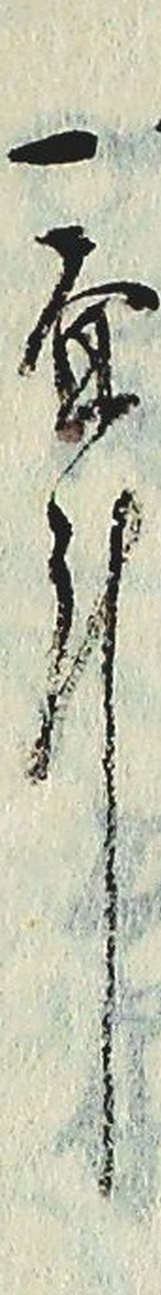一昼計
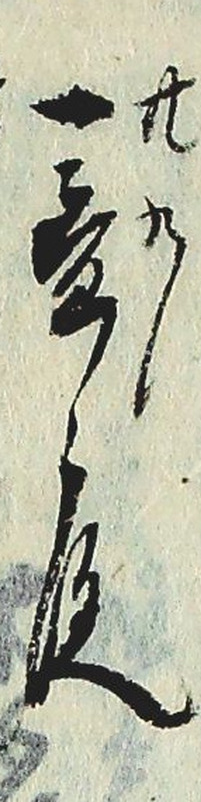一昼夜
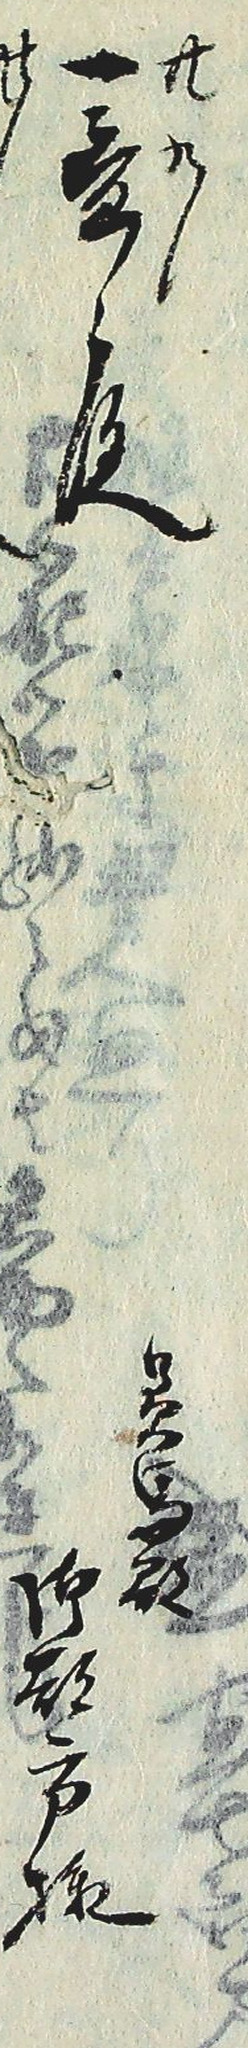一昼夜御郡方様
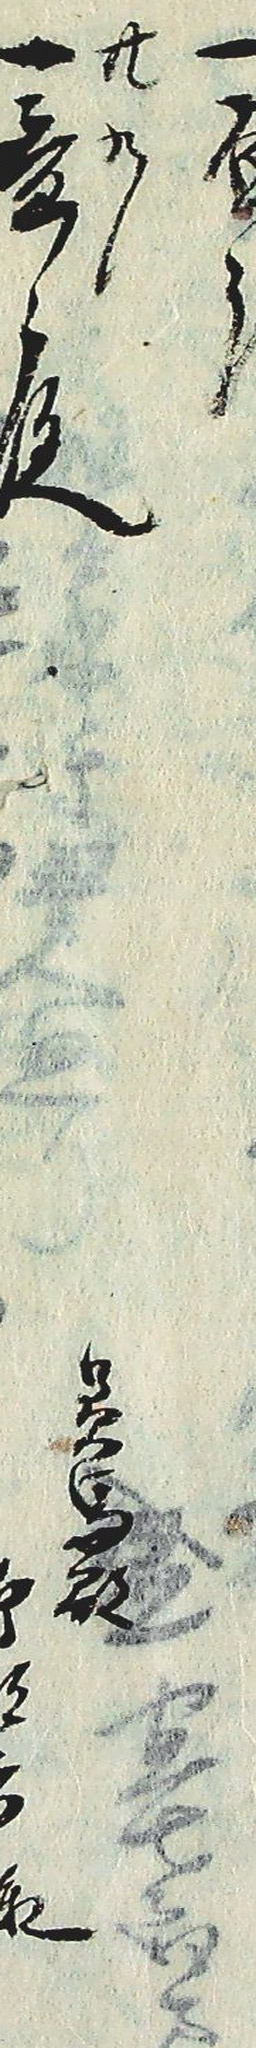一昼夜美馬郡
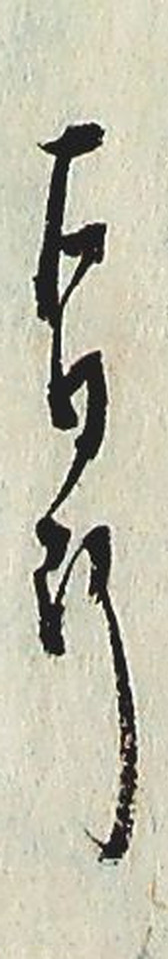廿一日
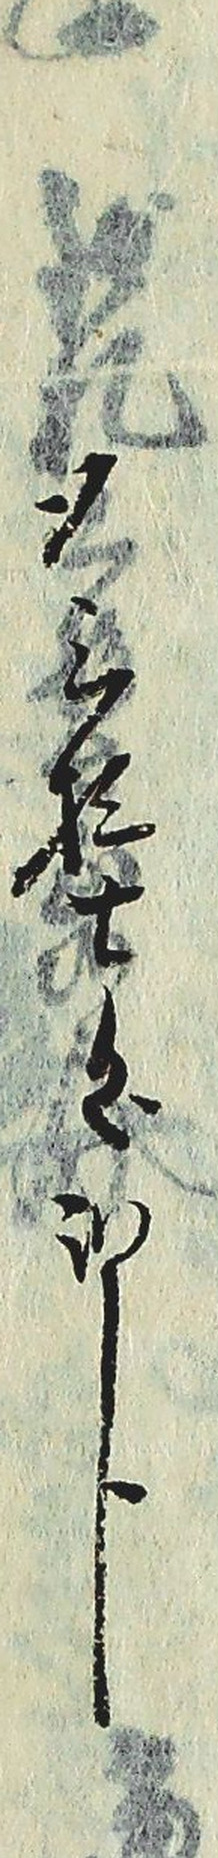〆三拾七匁弐分
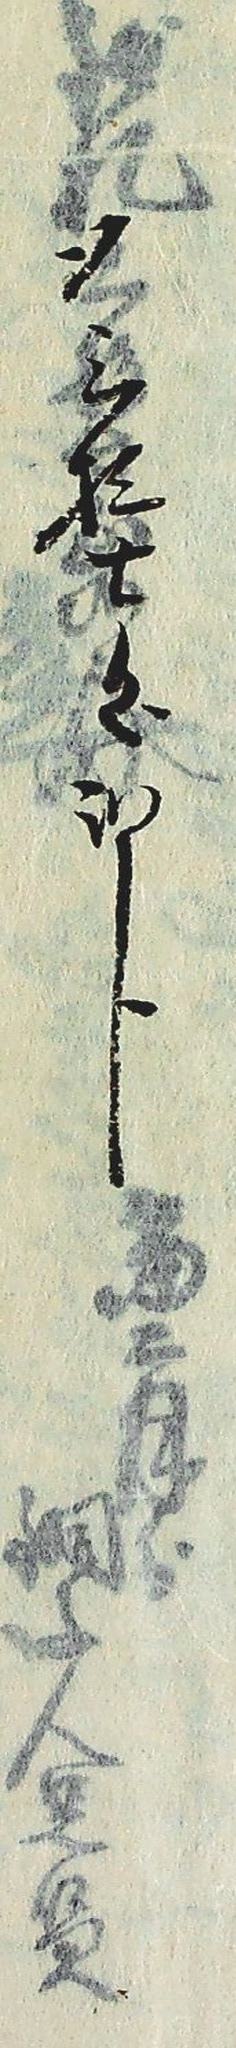〆三拾七匁弐分
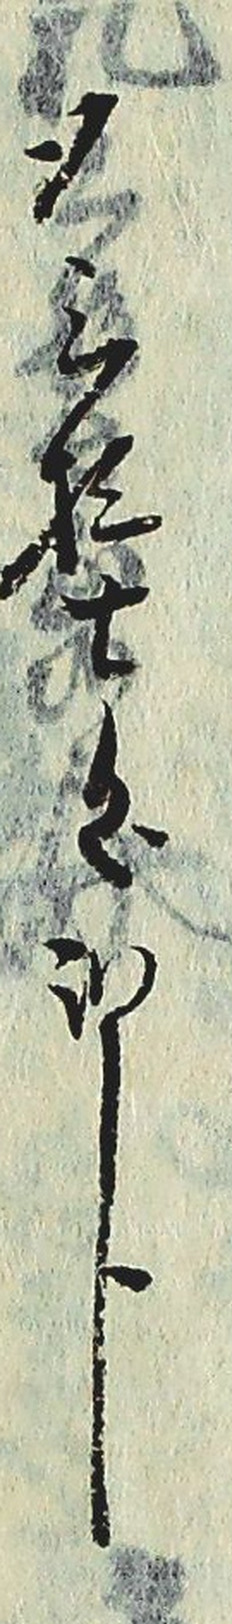〆三拾七匁弐分
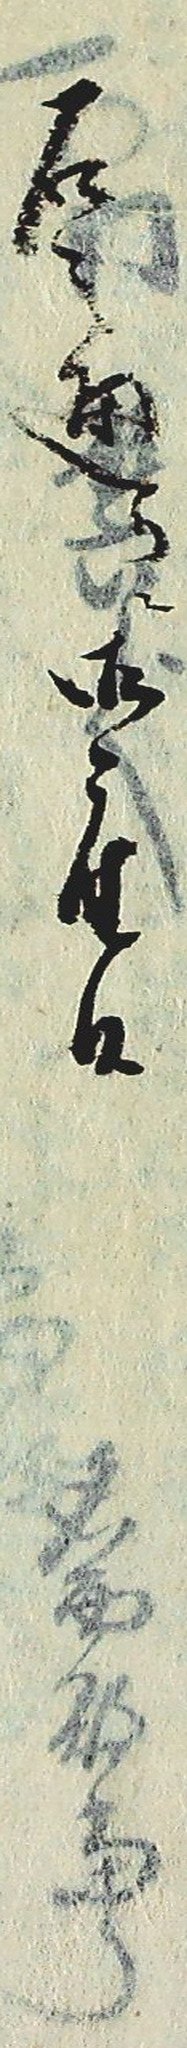右之通に御座候
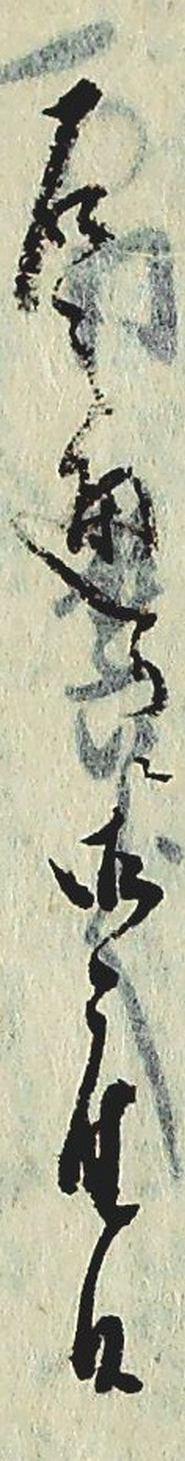右之通に御座候
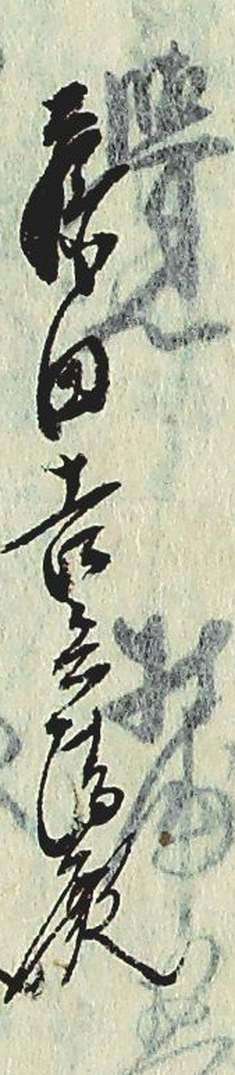藤田吉兵衛殿
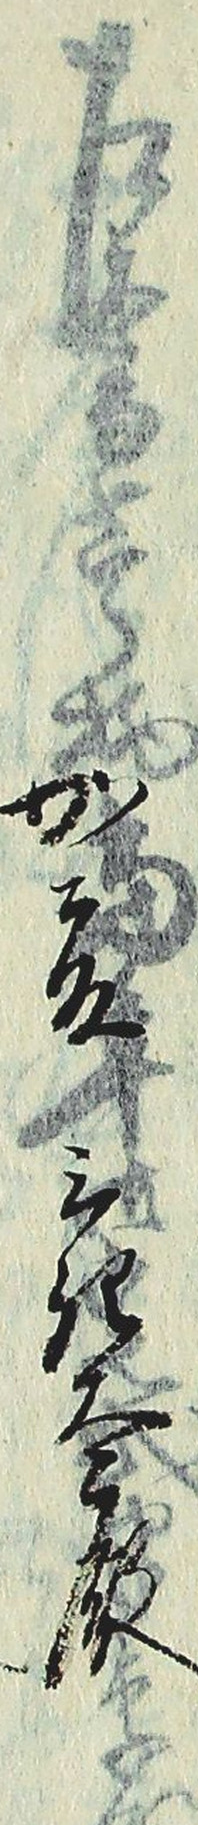加藤三記太郎殿
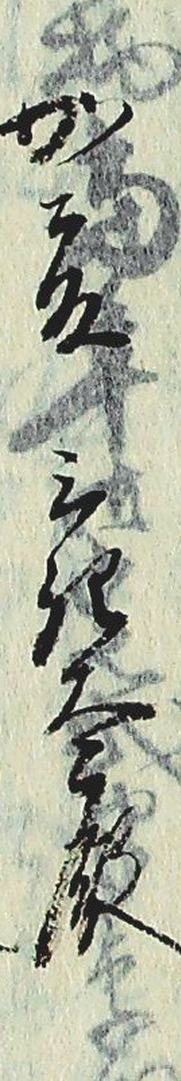加藤三記太郎殿
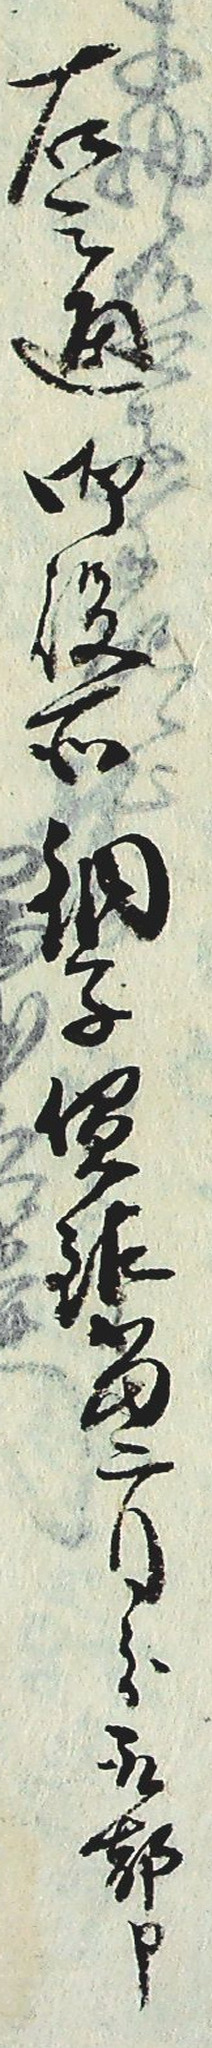右之通御役所銅子賃金当二月分取都申
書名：名東郡中諸割賦元帳
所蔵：鳴門教育大学 Naruto University of Education
